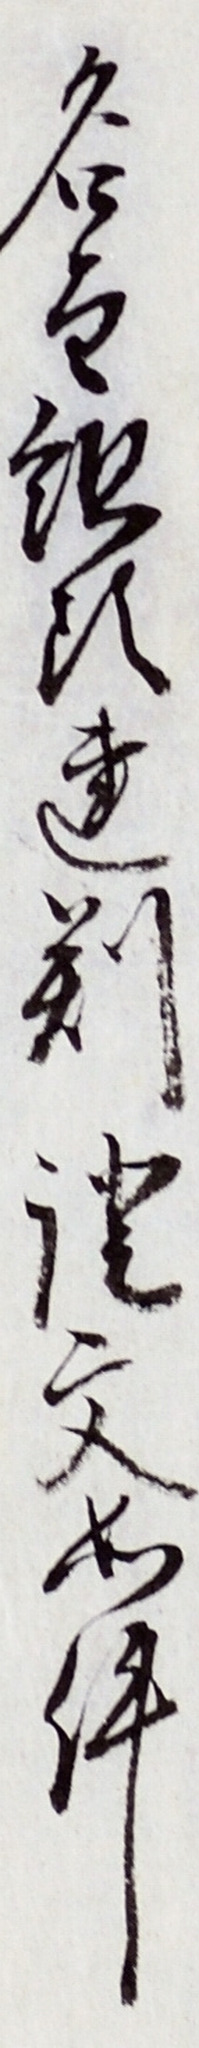名主組頭連判証文如件
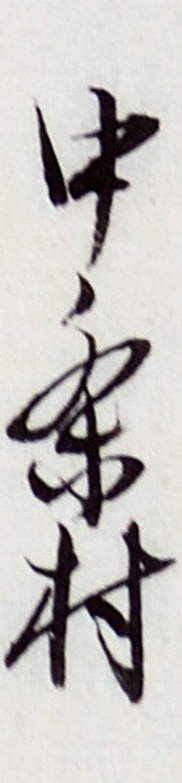中条村
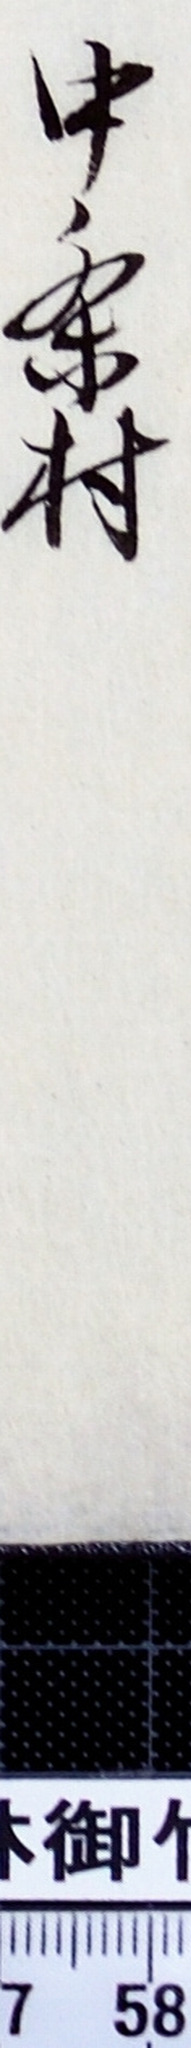中条村
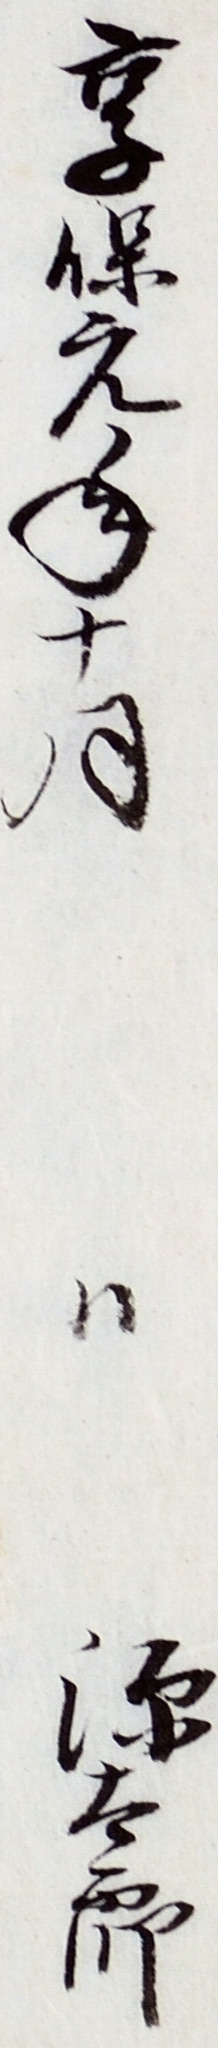享保元年十月同源太郎
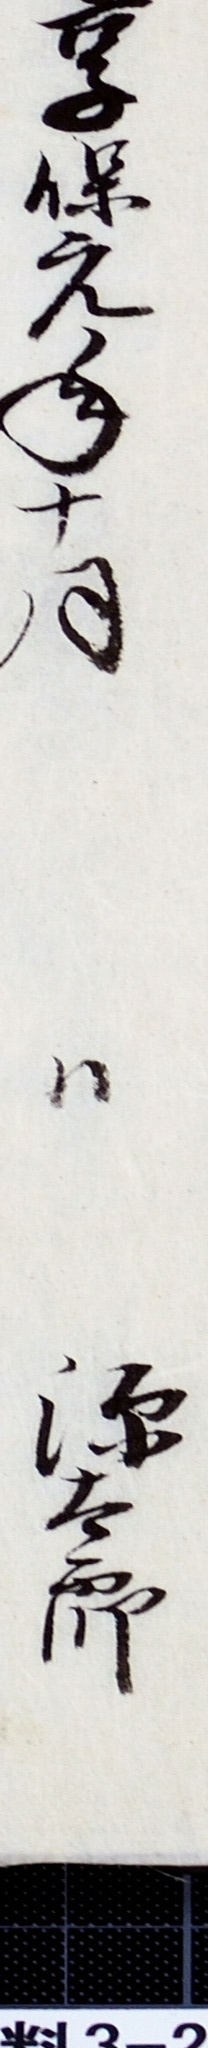享保元年十月同源太郎
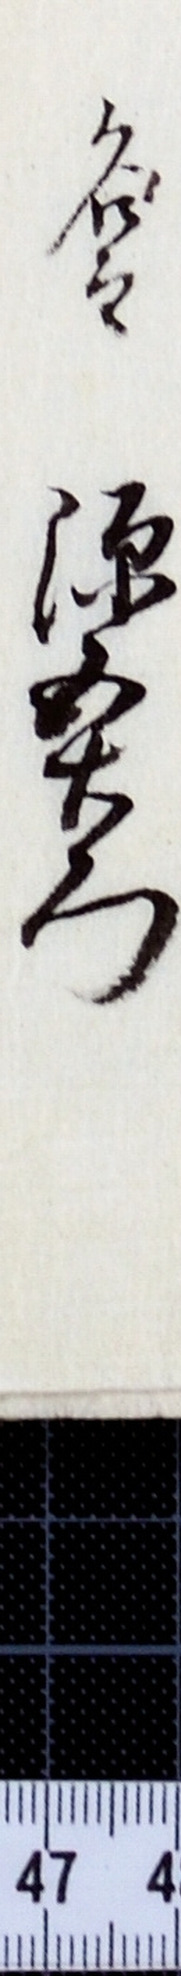名主源五右衛門
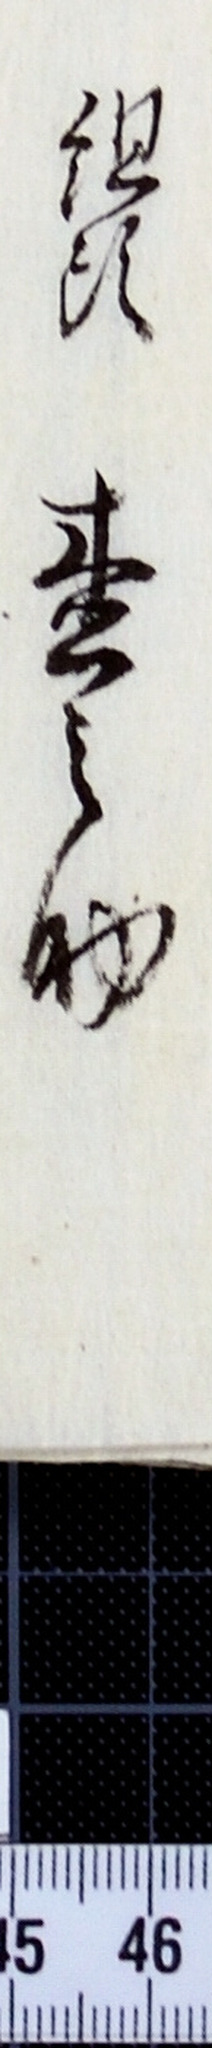組頭杢之助
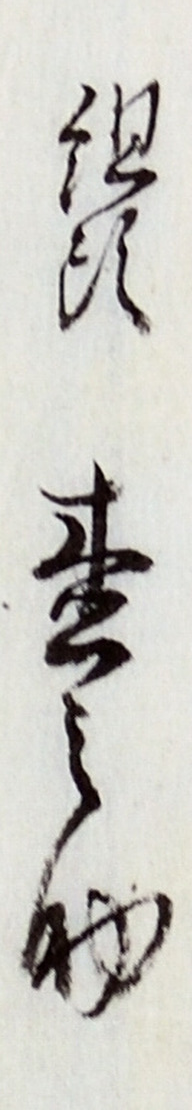組頭杢之助
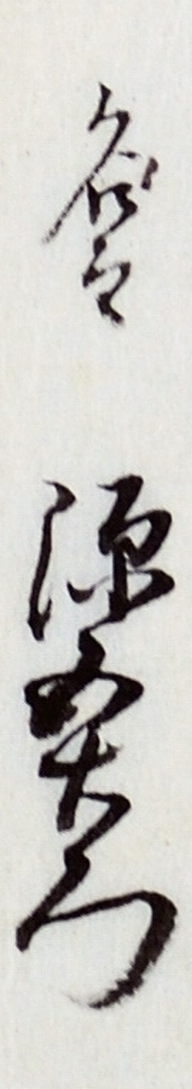名主源五右衛門
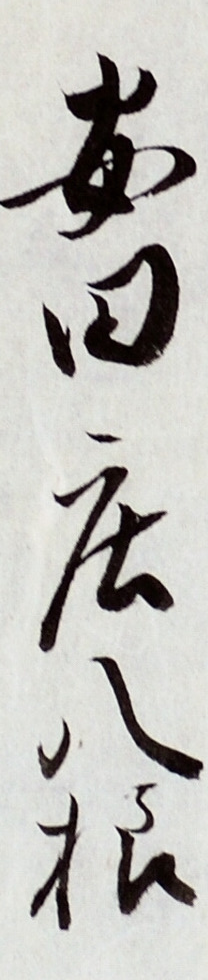安田庄八様
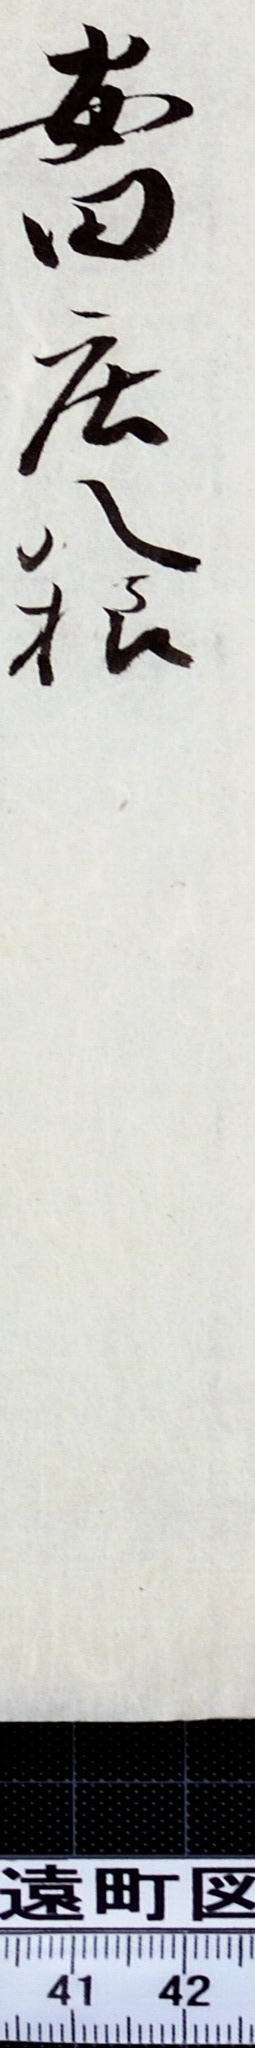安田庄八様
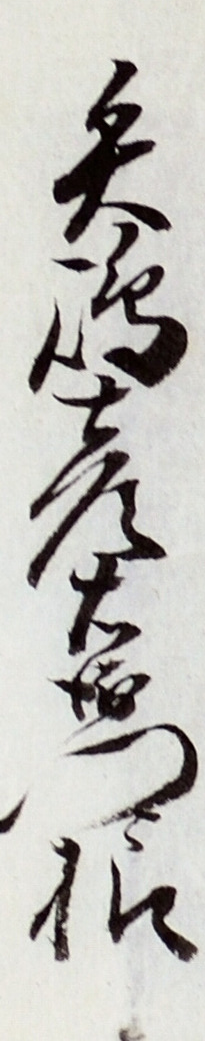矢嶋彦右衛門様
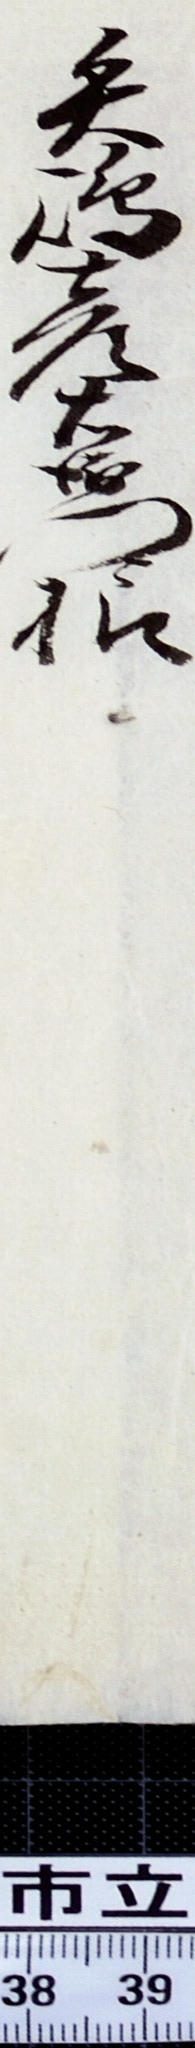矢嶋彦右衛門様

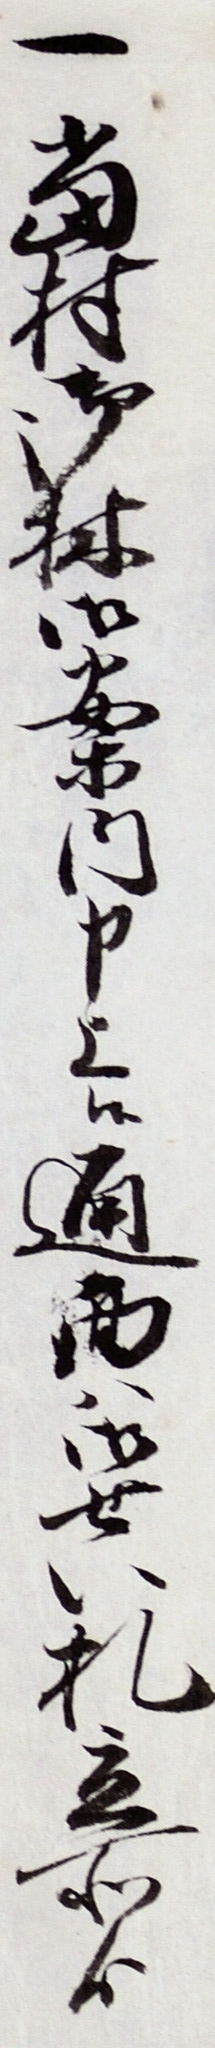一当村御林御案内申上候通西ハ御せい札立所ゟ
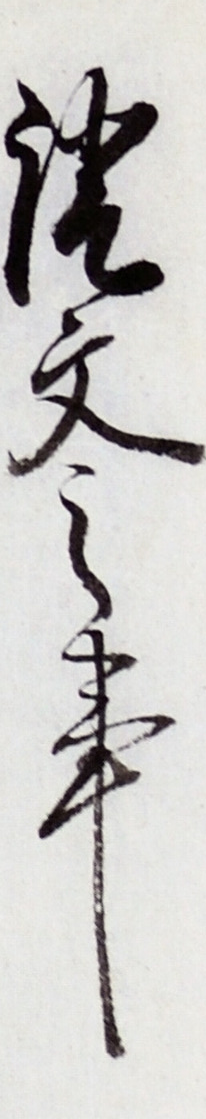証文之事
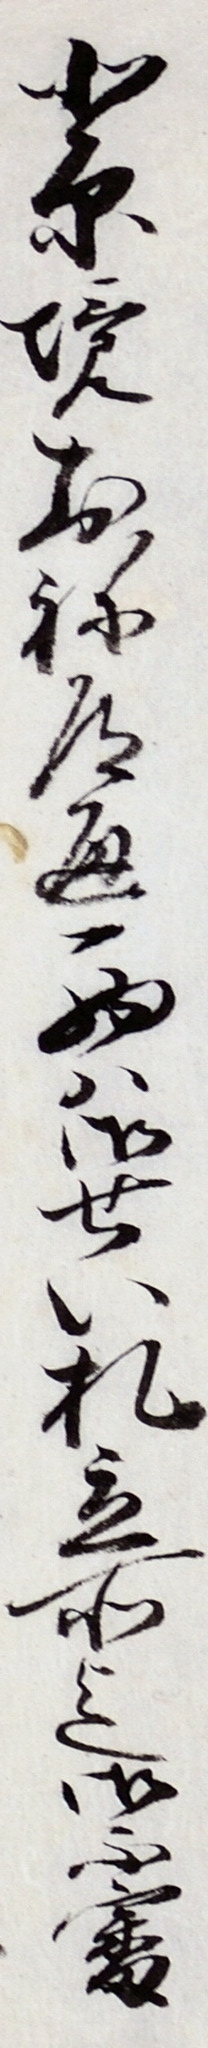北原境おね道通西ハ御せい札立所迄御不審
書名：御林御竹藪証文控
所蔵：伊那市立高遠町図書館・合同会社AMANE
